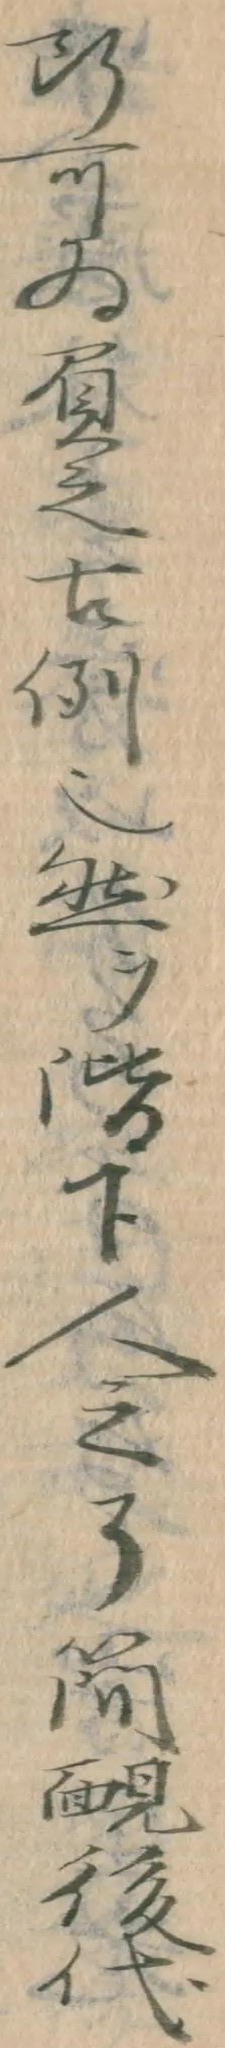断可為負之古例也然ヲ階下人之了簡靦後代
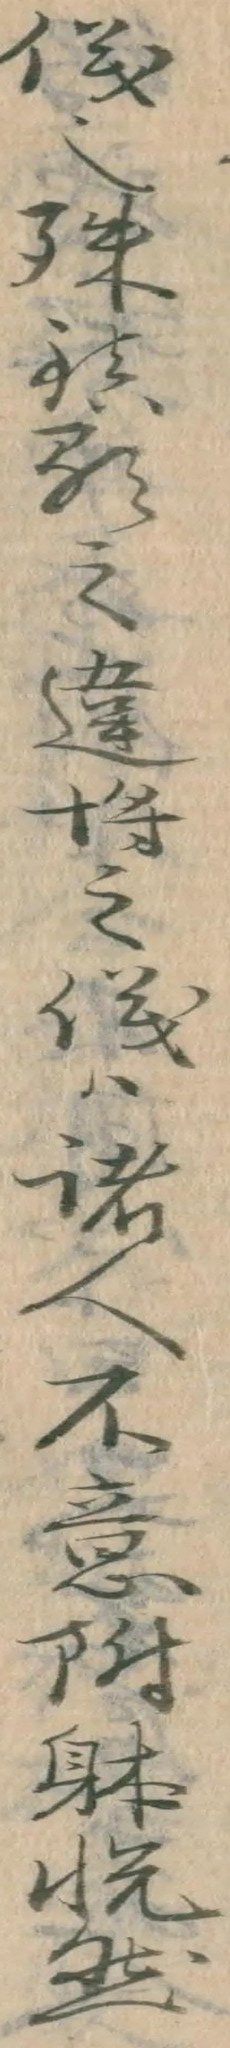儀也殊鎮顕之違埒之儀ハ諸人不意附体悦然
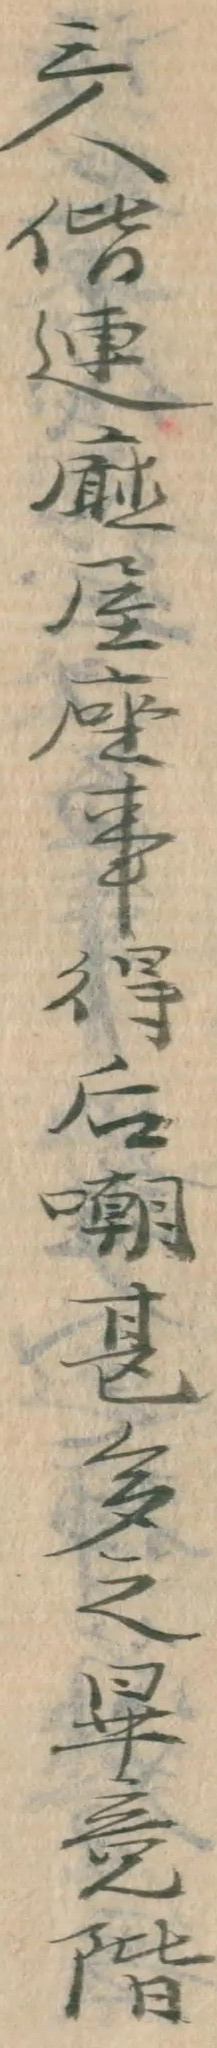三人偕連庁屋座事得后嘲甚多之畢竟階
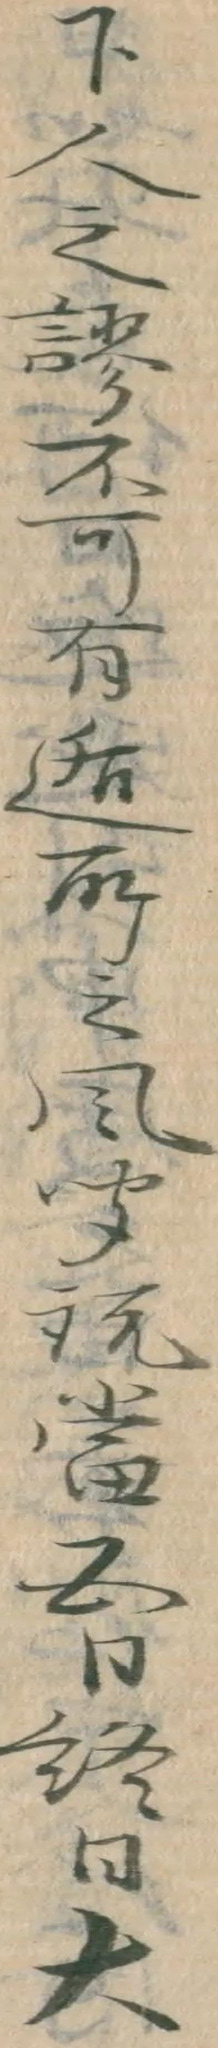下人之謬不可有遁所之風聞説当五日終日大
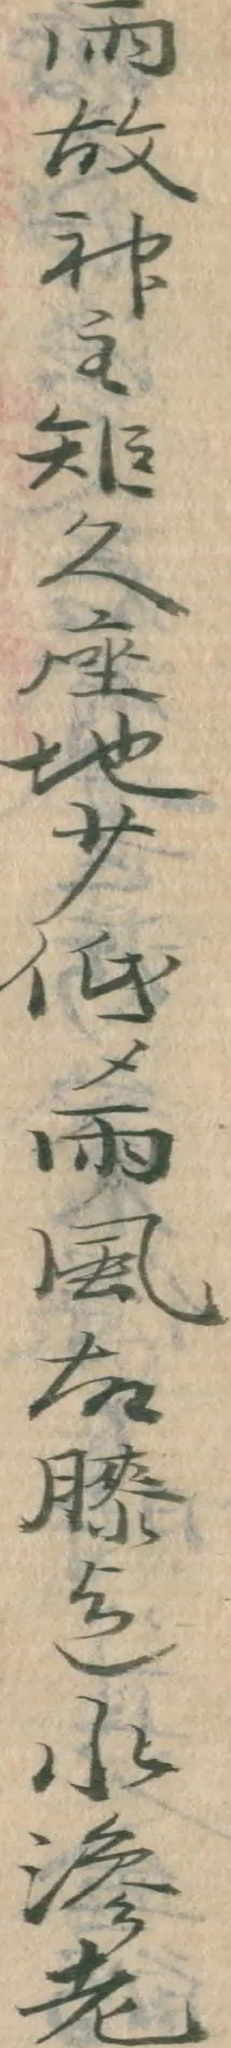雨故神主矩久座地少低シテ雨風故膝迄水滲老
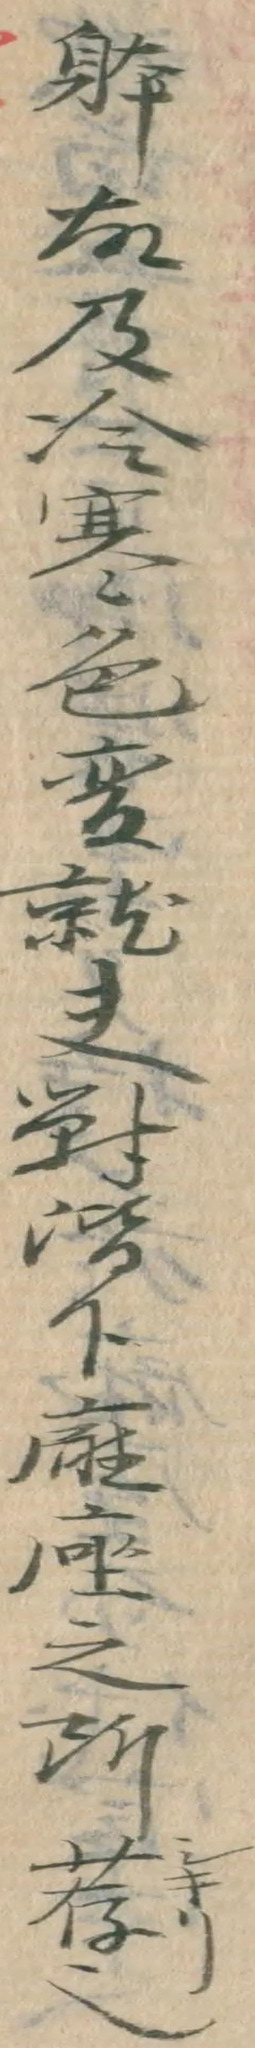体故及冷寒色変就夫対階下庁座之所荐也
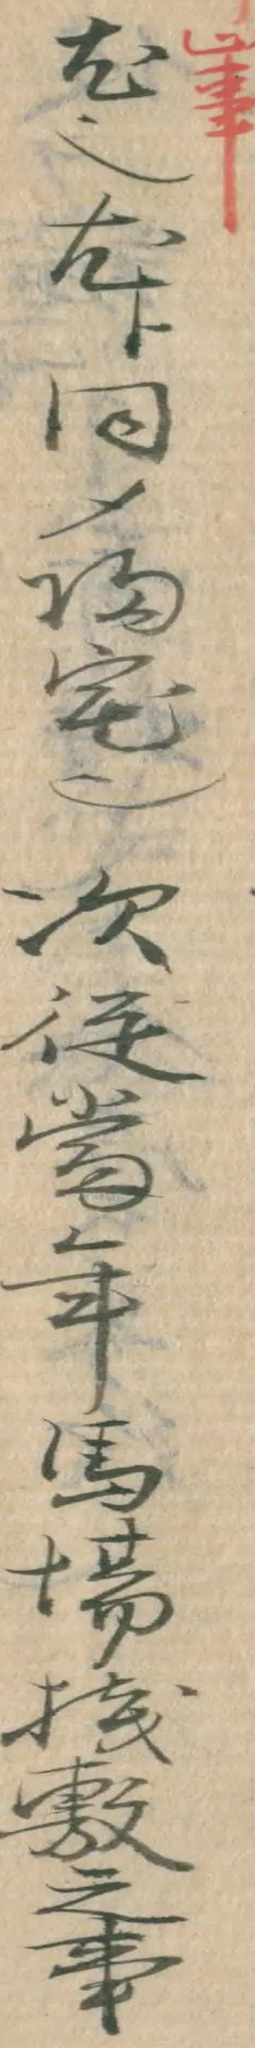尤也尤ト同シテ帰宅也次従当年馬場桟敷之事
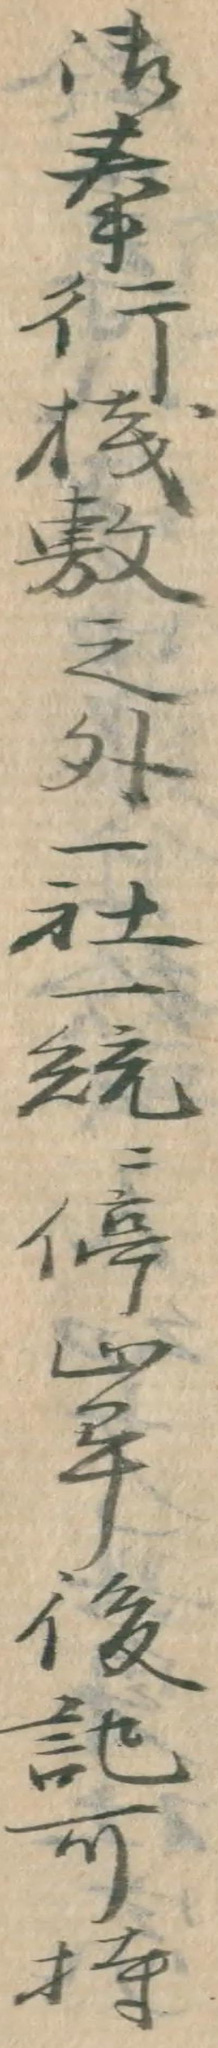御奉行桟敷之外一社一統ニ停止畢後記可持
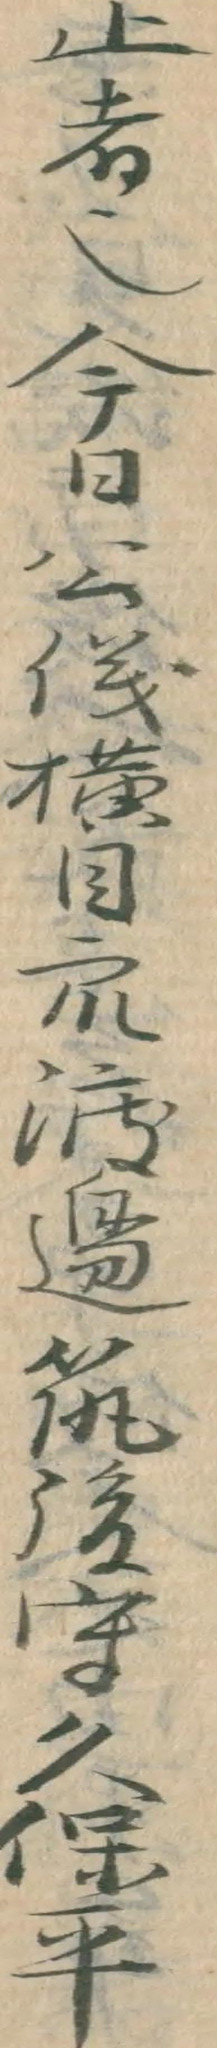止者也今日公儀横目衆渡辺筑後守久保平
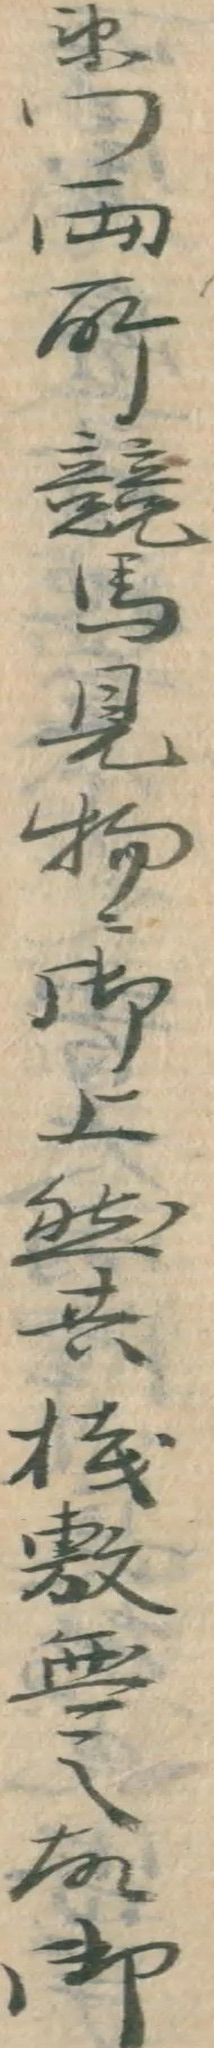衛門両所競馬見物ニ御上然共桟敷無之故御

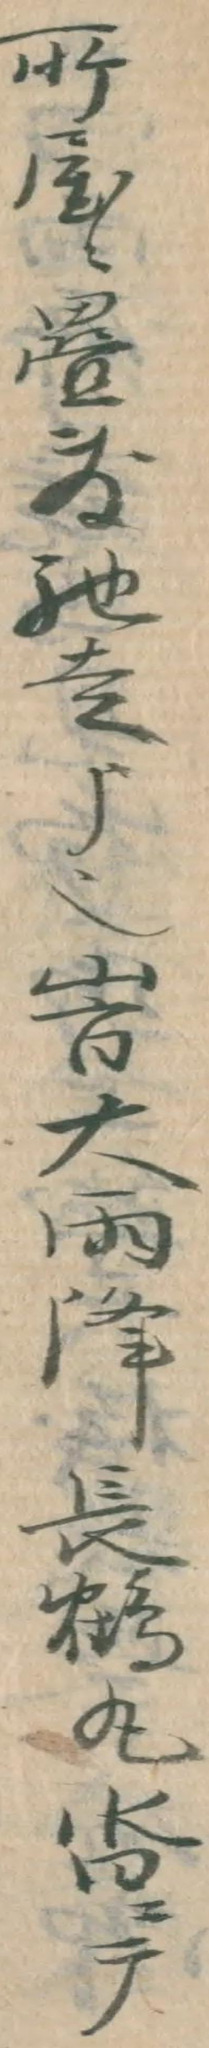所屋ニ畳敷馳走申也旹大雨降長鶴丸沓ニテ
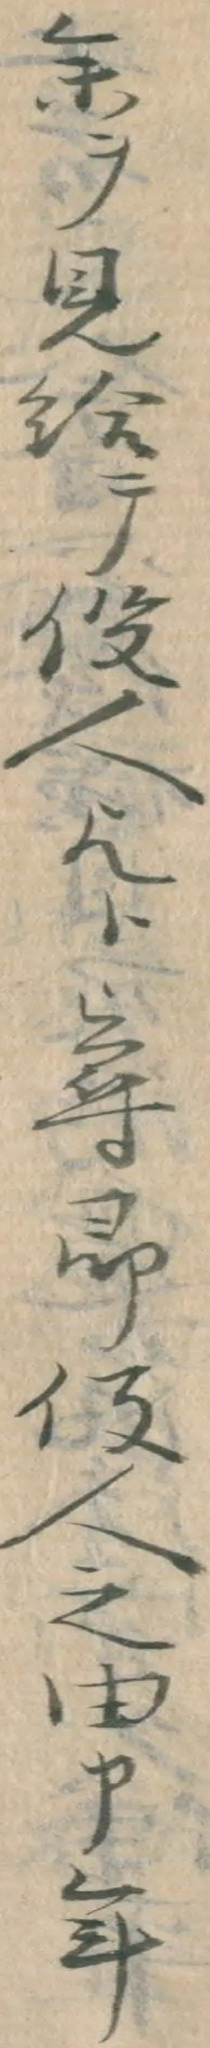参ヲ見給テ役人歟ト尋即役人之由申年
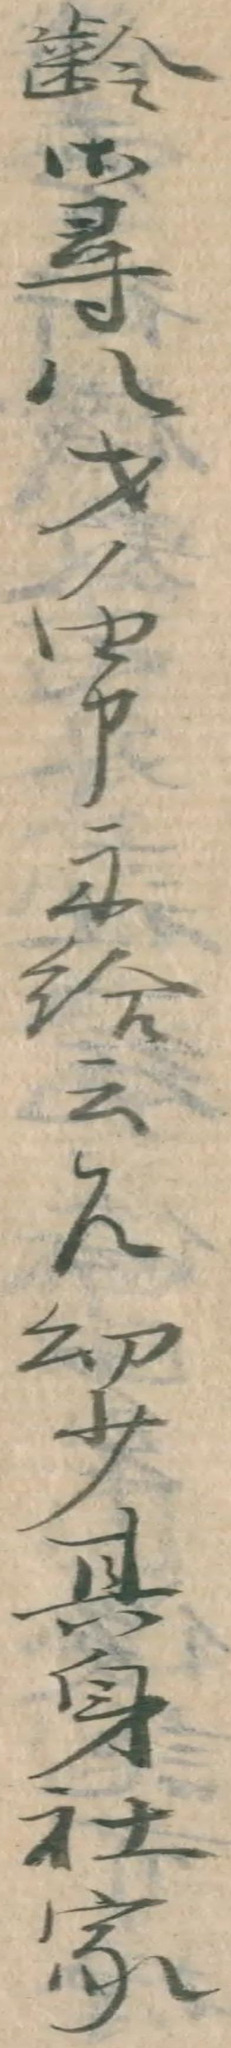齢御尋八才ノ由申示給云乍幼少其身社家
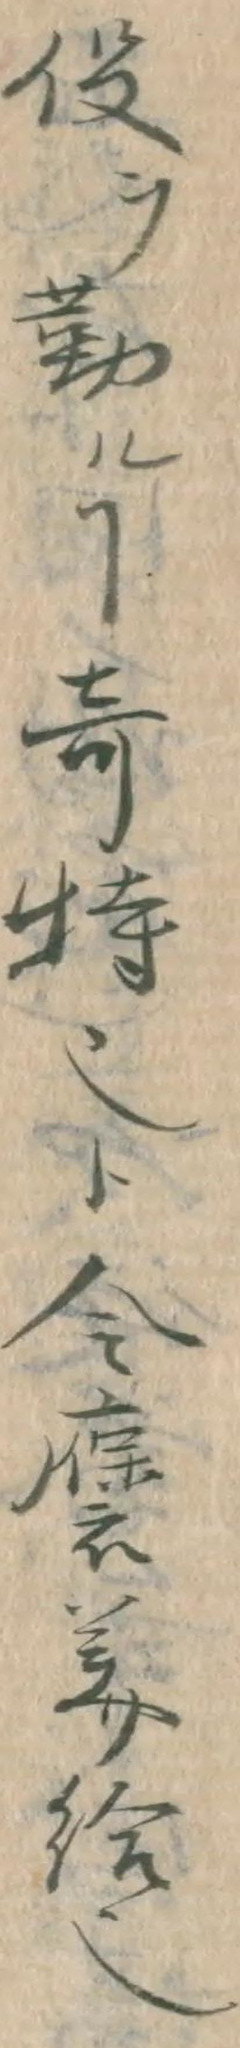役ヲ勤ルコト奇特也ト令褒美給也
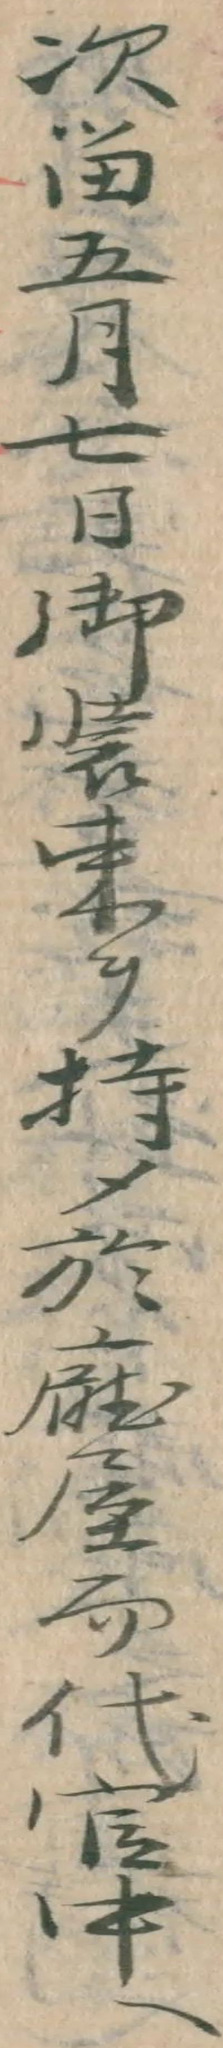次留五月七日御装束ヲ持シテ於庁屋而代官中へ
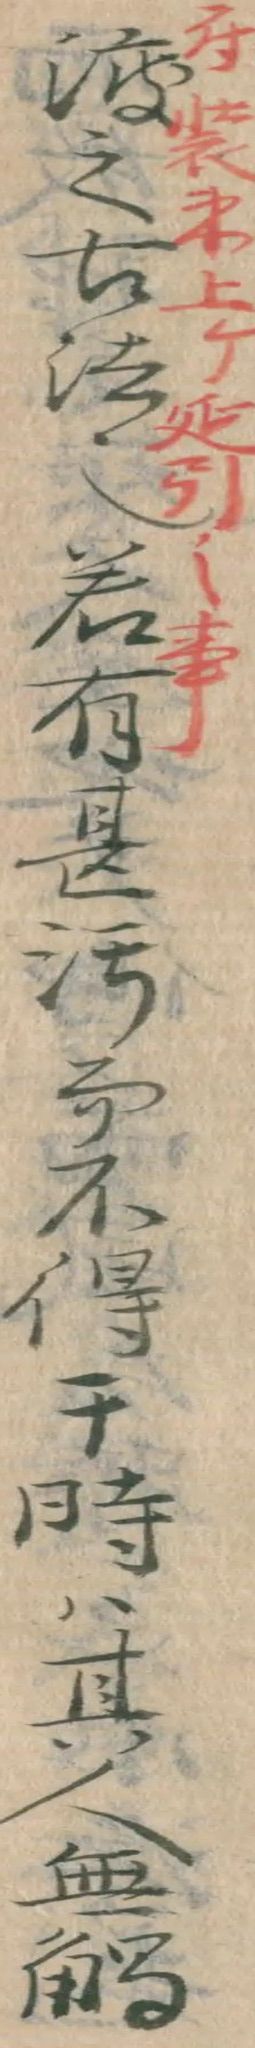渡之古法也若有甚汚而不得于時ハ其人無触
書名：賀茂社記録. 第10冊
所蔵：国立国会図書館 National Diet Library, JAPAN
